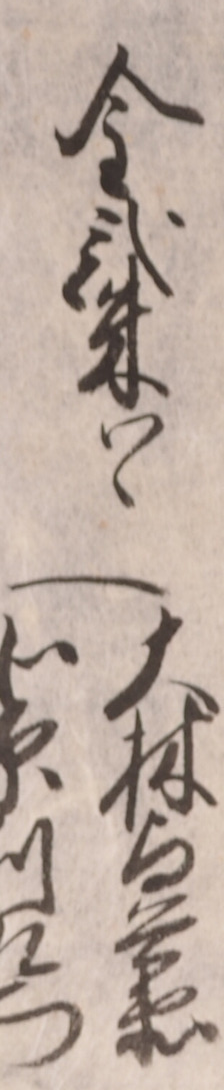金弐朱ツヽ大林与兵衛
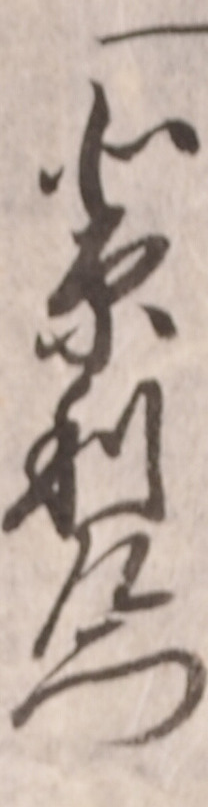北原利左衛門
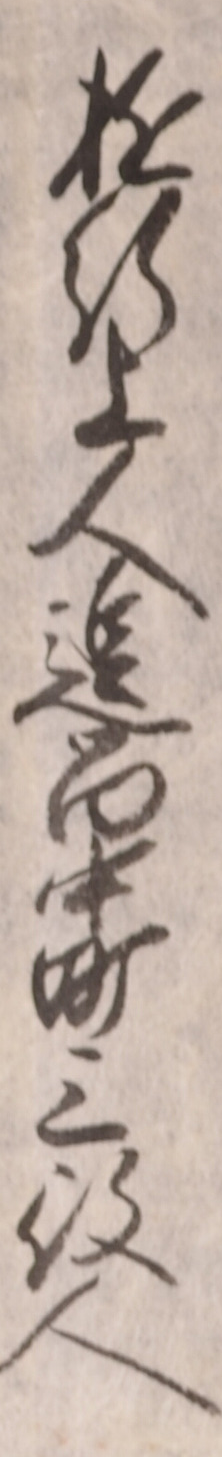遊行上人逗留中町三役人
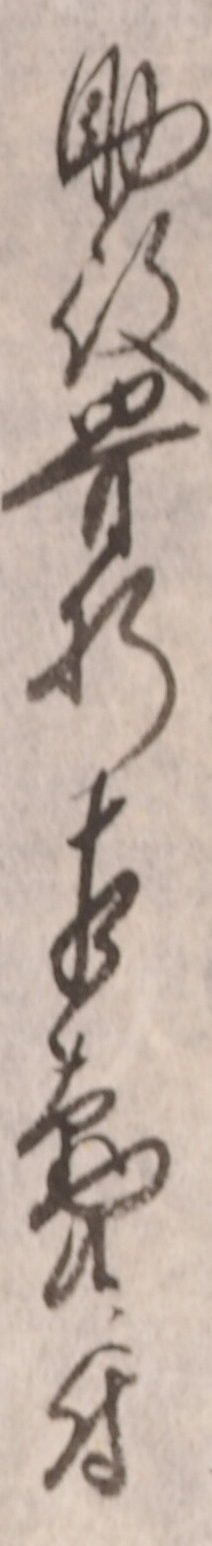助役骨折相勤候ニ付
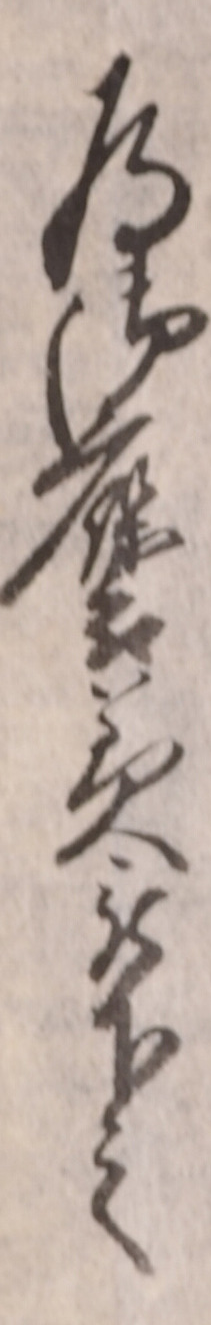為御褒美被下之
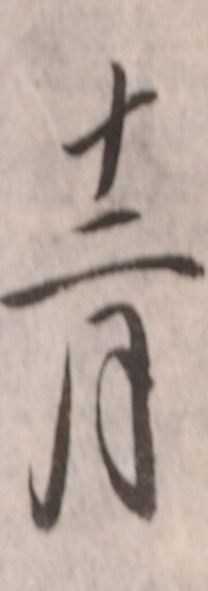十二月
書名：覚
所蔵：伊那市立高遠町図書館・合同会社AMANE
